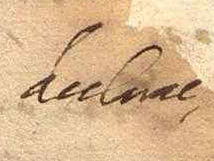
declaraç
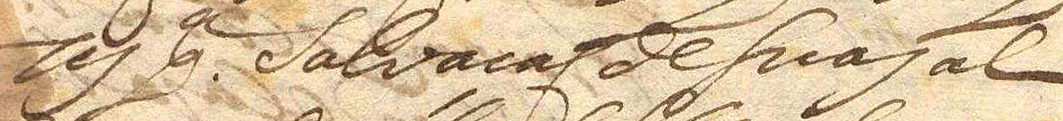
zes p.a salvaçaꝭ de suas al
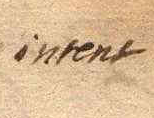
intent
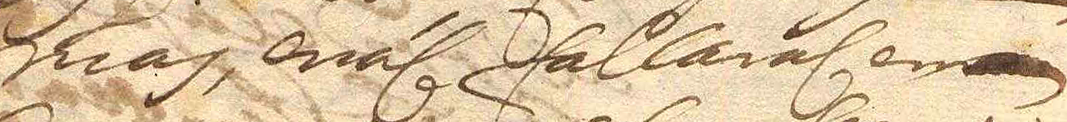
mas, e naꝭ fallaraꝭ em_
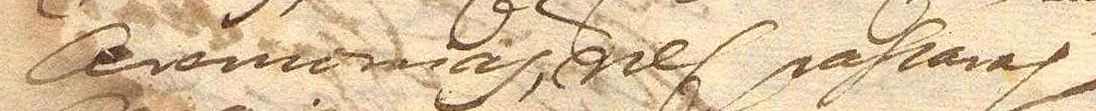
Ceremonias, neꝭ passaraꝭ
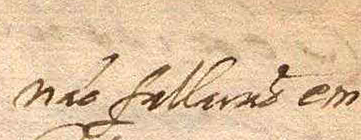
naõ fallaraõ em
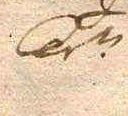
Cer.as
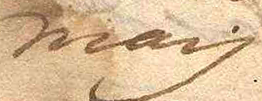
mais
